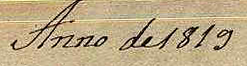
Anno de 1819
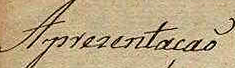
Aprezentaçaõ
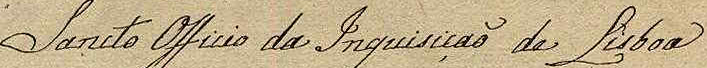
Sancto Officio da Inquisiçaõ de Lisboa
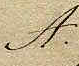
A.
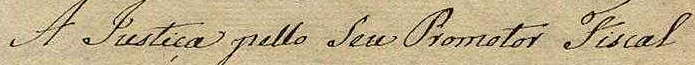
A Iustiça pello seu Promotor Fiscal
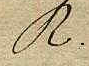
R.
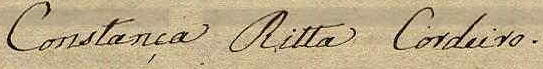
Constança Ritta Cordeiro.
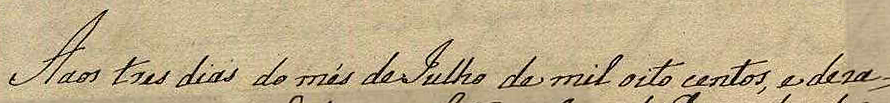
Aaos tres dias do més de Iulho de mil oitocentos, e deza
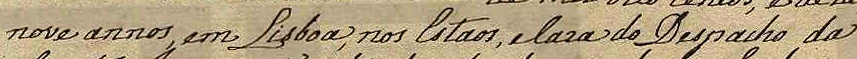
nove annos, em Lisboa, nos Estaos, e Caza do Despacho da
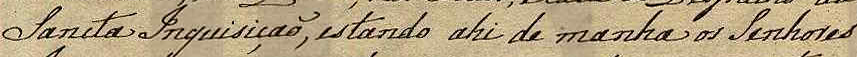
Sancta Inquisiçaõ, estando ahi de manha os Senhores
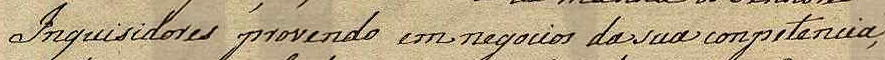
Inquisidores provendo em negocios da sua competencia,
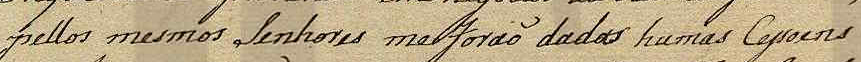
pellos mesmos Senhores me foraõ dados humas Cessoens
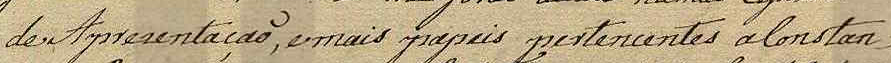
de Aprezentaçaõ, e mais papeis pertencentes a Constan
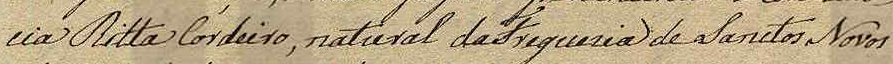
cia Ritta Cordeiro, natural da Freguezia de Sanctos Novos
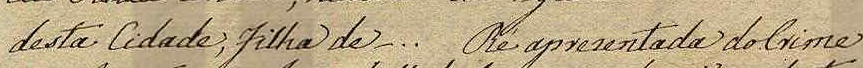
desta Cidade, filha de Ré aprezentada do Crime
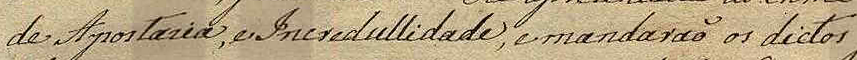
de Apostazia, e Incredullidade, e mandaraõ os dictos
